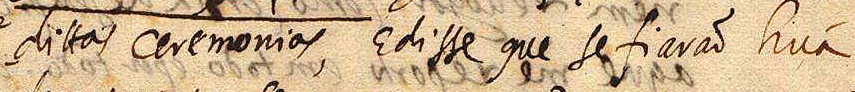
dittas ceremonias, E disse que se fiaraõ huā
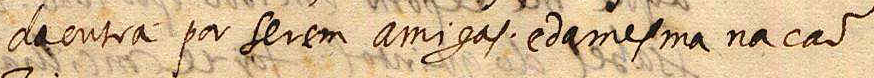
da outra por serem amigas. e da mesma nacaõ
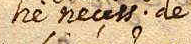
hè necessro. de
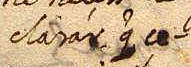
clarar q̄. ce
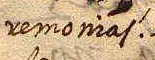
remonias.
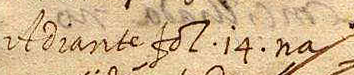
Adiante fol. i4. na
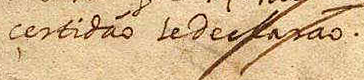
certidaõ se declarão.
